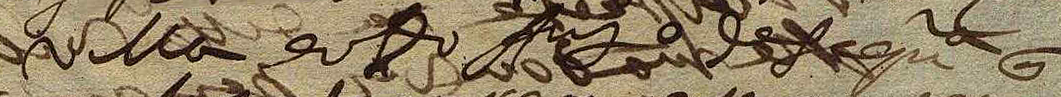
villa e o Dr Anto de sequra q̄
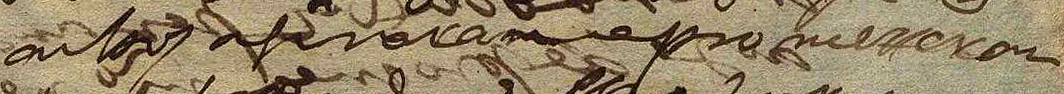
anbos asinaram e prometteron
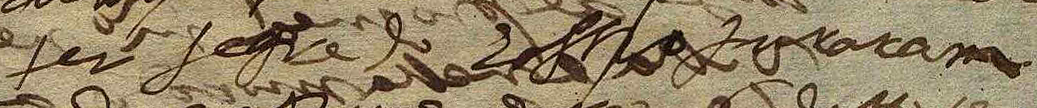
ter segredo E assj o Juraram
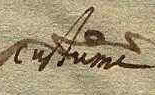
custume
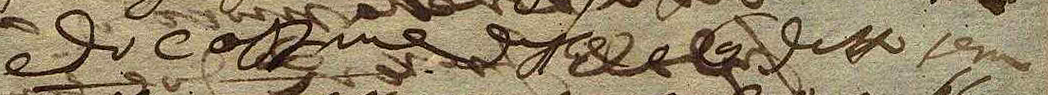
e do costume disse o q̄ ditto tem
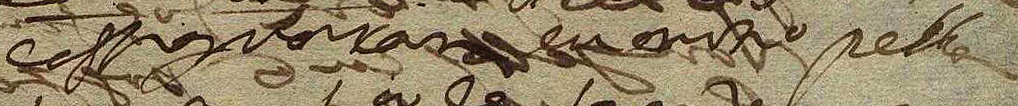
e assignaram eu notro pella
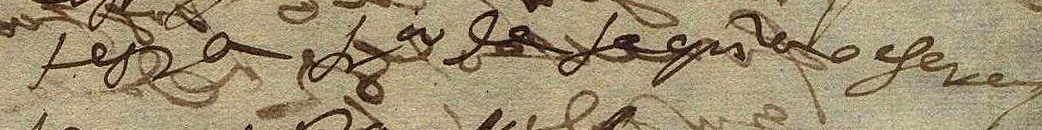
testa frco de sequra o escreuj
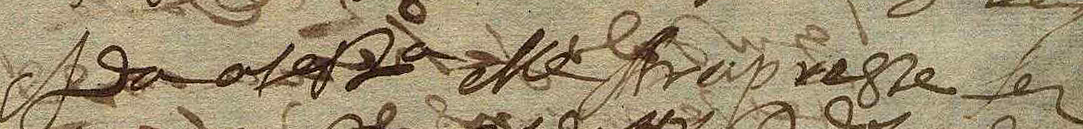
E Jda a testa elle Arcipreste fez
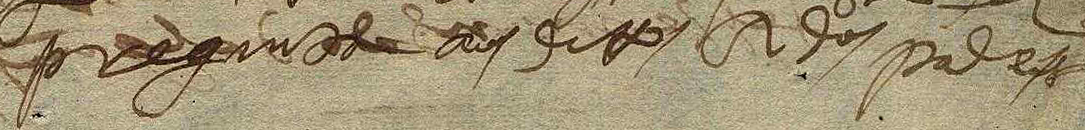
pregunta aos dittos Rdos padres
